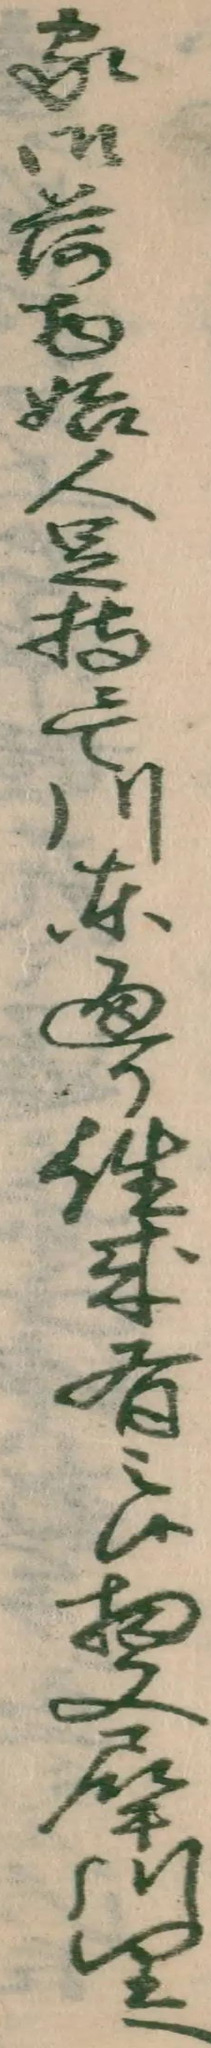家御荷物始人足持二て川東通り往来有之候扨又犀川里へ
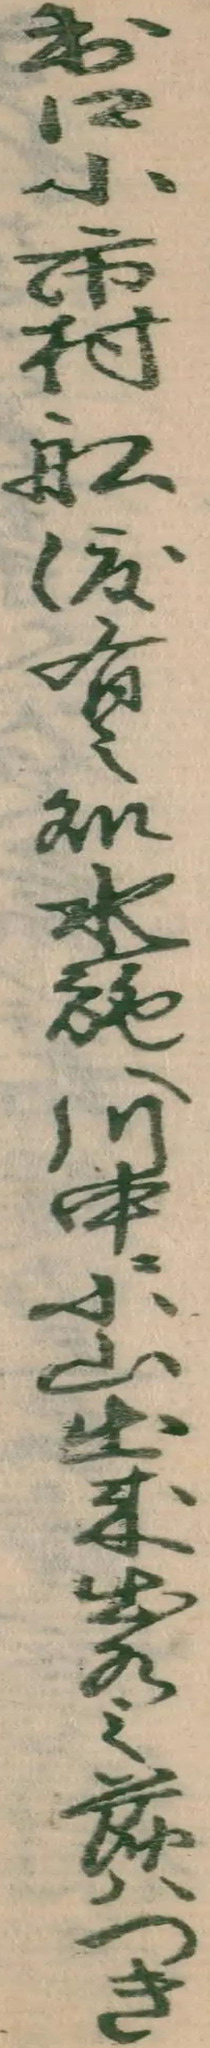出口小市村船渡有之処水絶へ川中二小山出来出水之節はつき
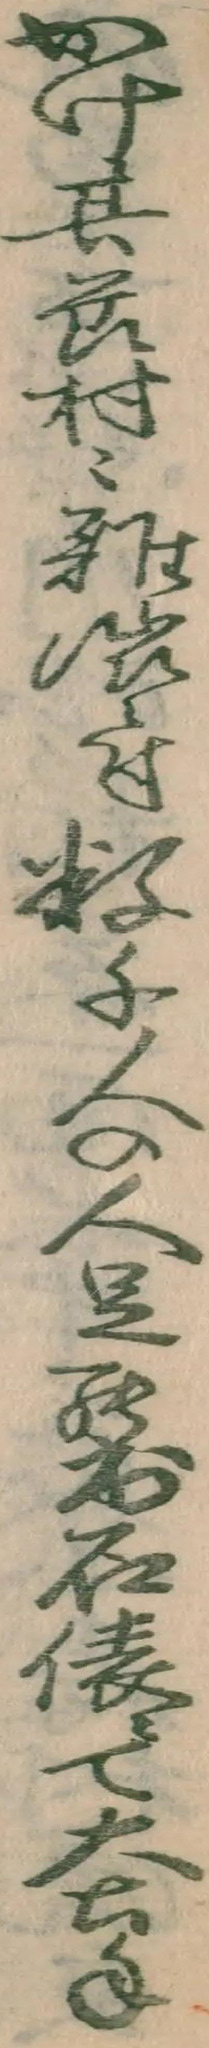かけ其節村々難渋二付数千人の人足罷出石俵二て大土手
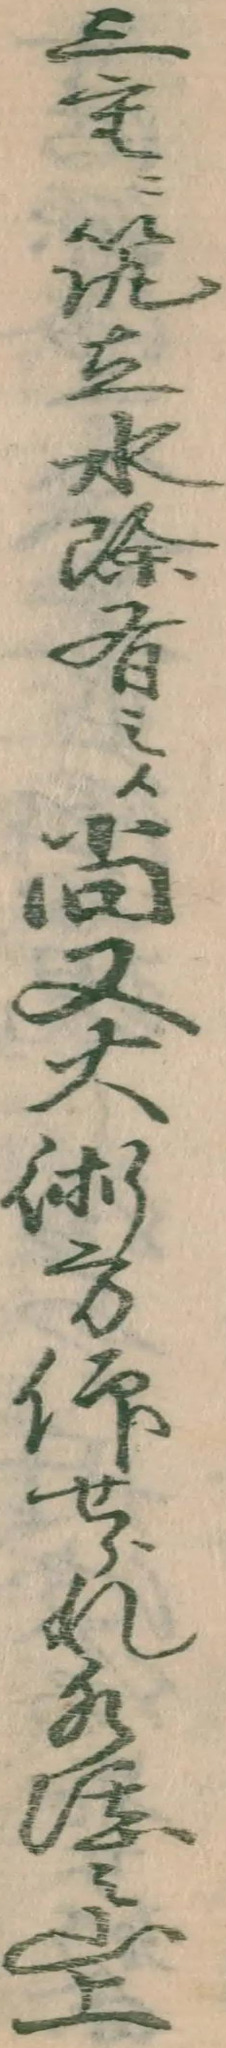三重二筑立水除有之候尚又火術方仰せられ水湛之山上
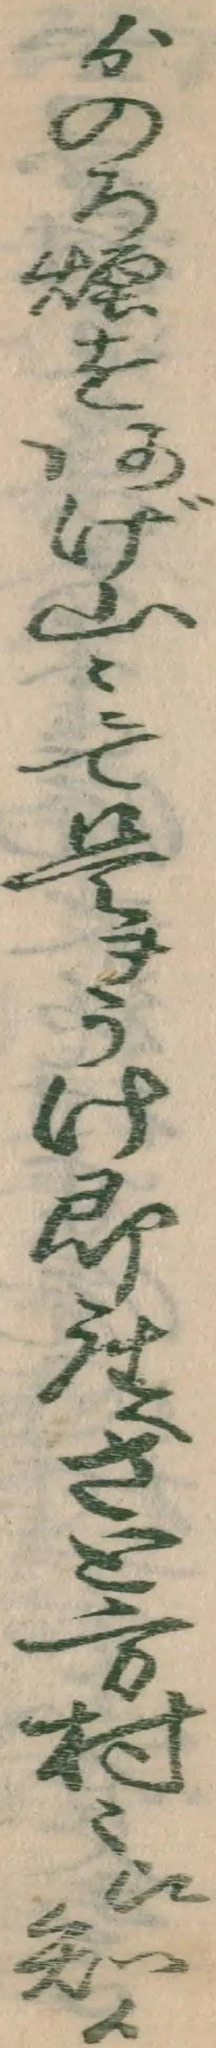ゟのろ煙をあげ山々二て是ヲうけ即座二さと方村々江知候
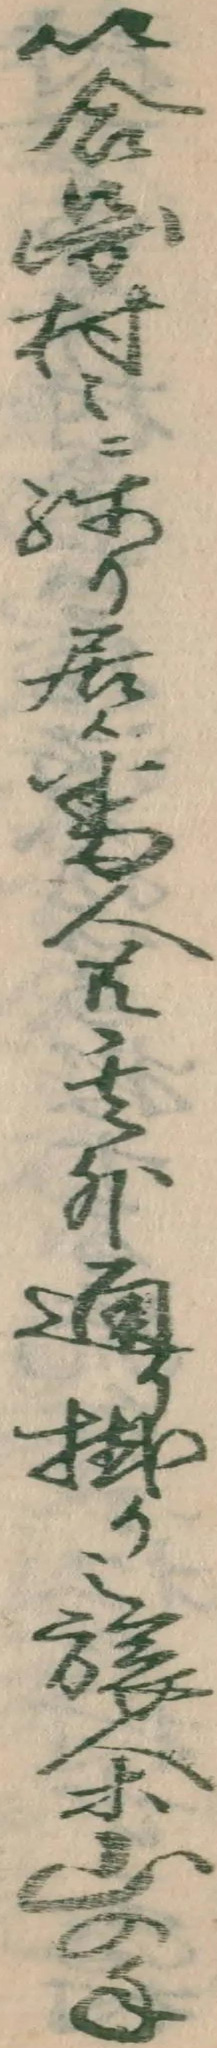以合図村々二残り居候番人共其外通り掛り之旅人等山の手
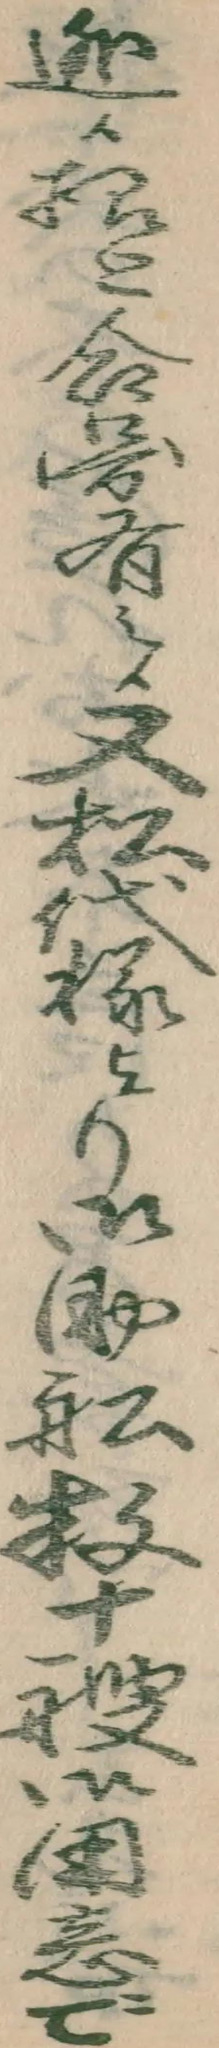逃候様と合図有之候又松代様より御助船数十艘御用意二て
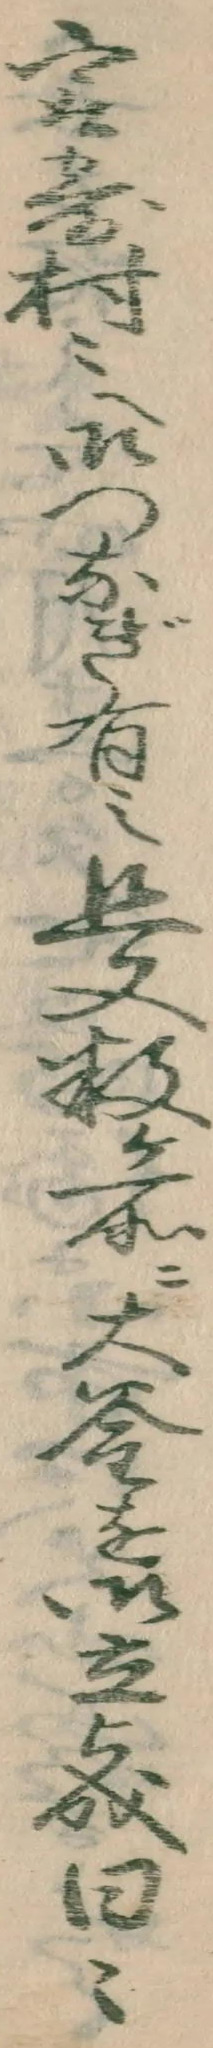最寄村々へ御つなぎ有之且又数ヶ所二大釜を御立被成日々
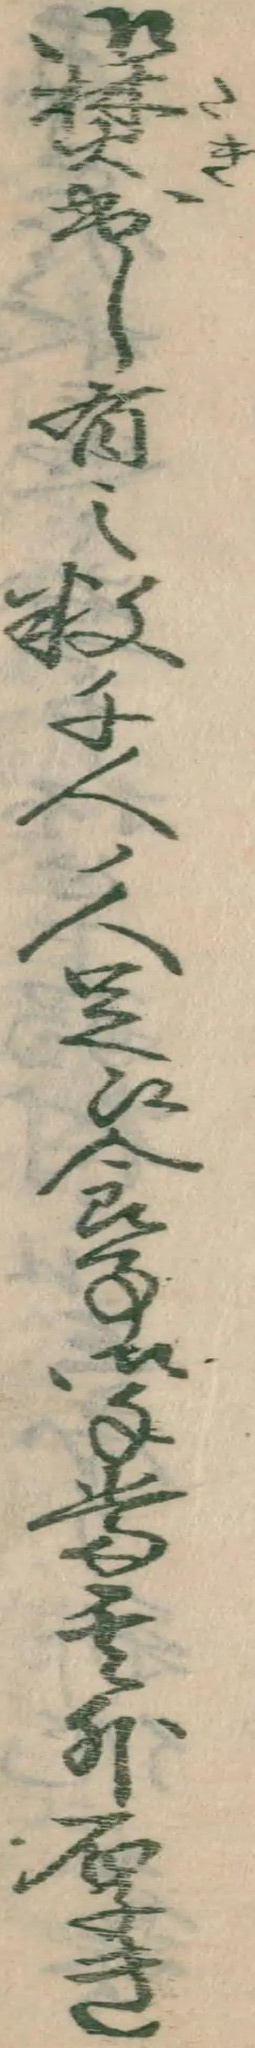御焚出し有之数千人之人足江食事御手当其外厚き
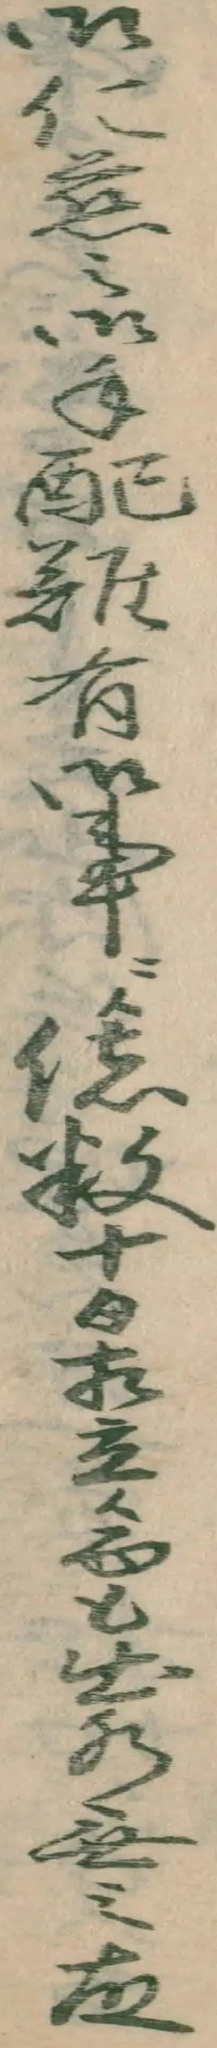御仁恵之御手配難有御事二候偖数十日相立候而も出水無之故

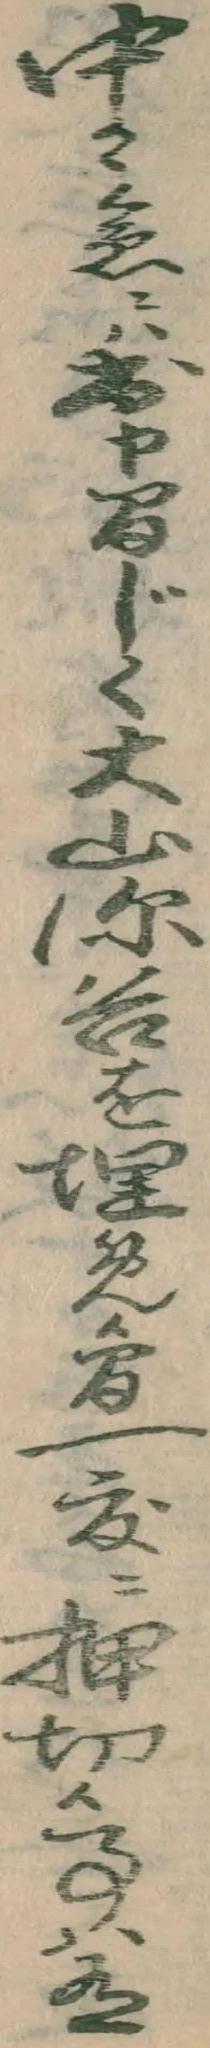中々急二は出申間じく大山深谷を埋め候間一度二押切候事は有
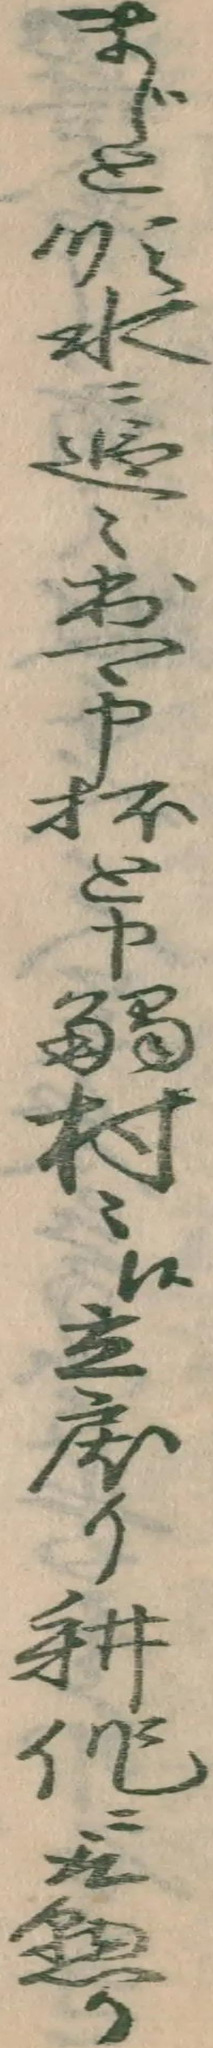まじと順水二追々出可申抔と申觸村々江立戻り耕作二取懸り
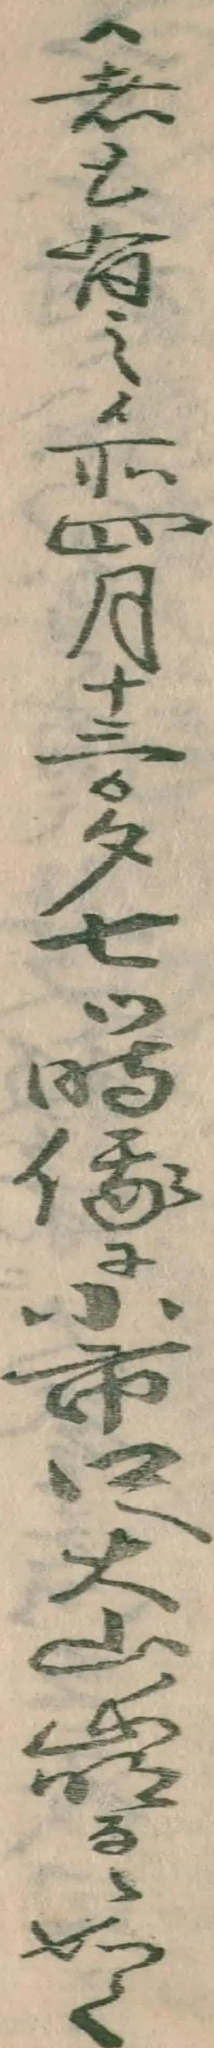候者も有之候所四月十三日夕七ッ時俄に小市口へ大山ノ崩るゝ如く
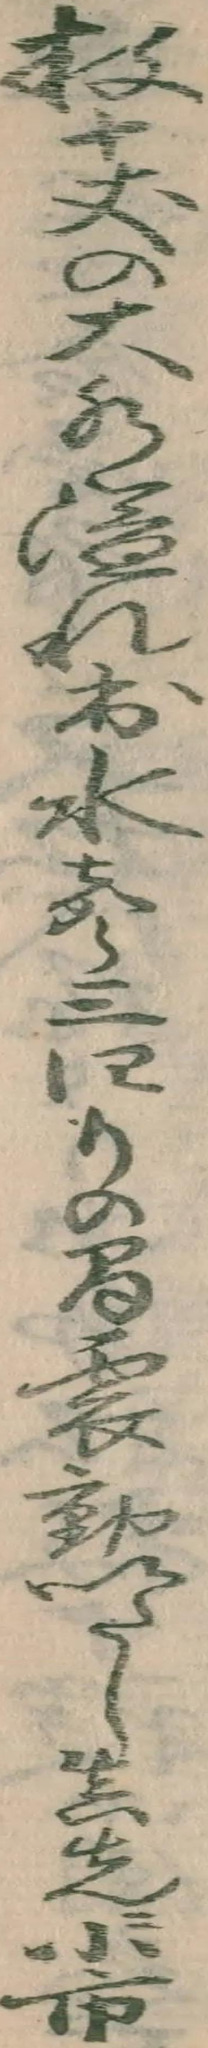数十丈の大水溢れ出水声三四里の間震動いたし真先二小市
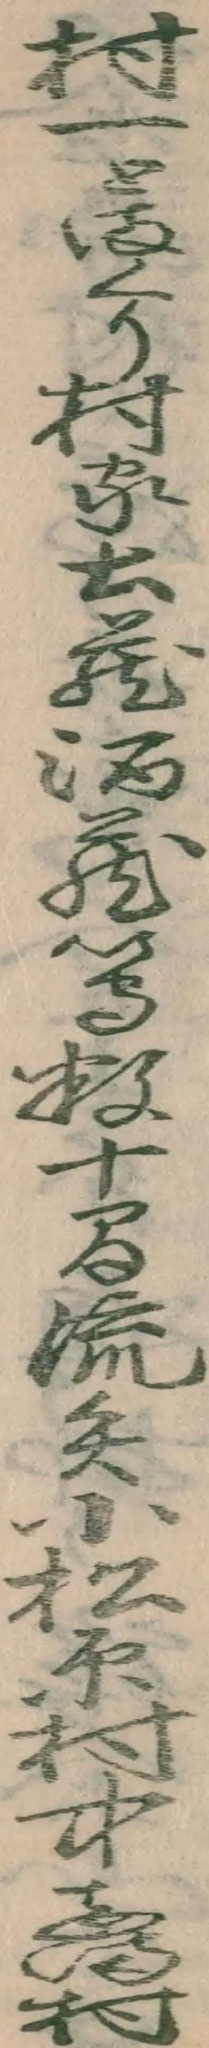村一とまくり村家土蔵酒蔵等数十間流失小松原村中しま村
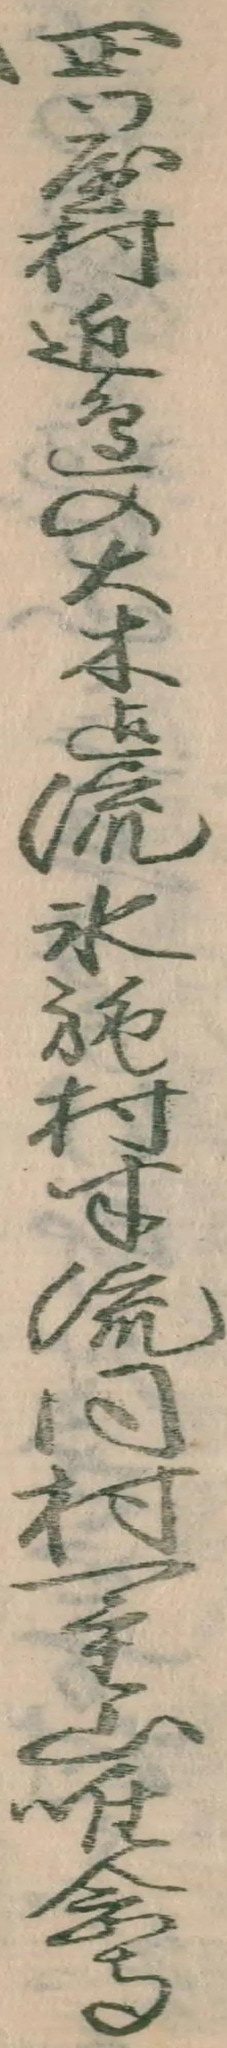四ッ屋村近辺の大木迄流氷鉋村半流同村一重山唯念寺
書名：大地震
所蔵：国立国会図書館 National Diet Library, JAPAN
